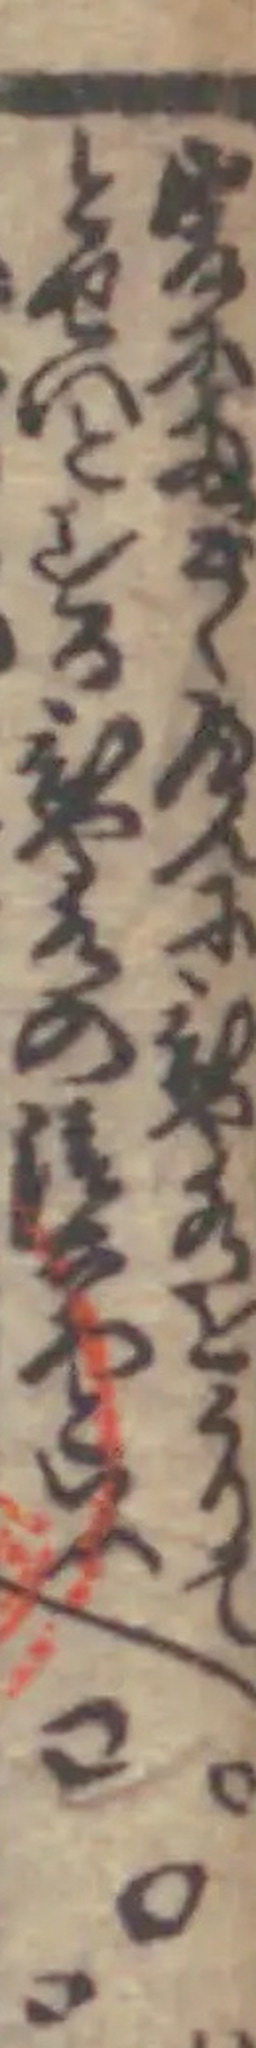とせいとするひや水の清右エ門といふ
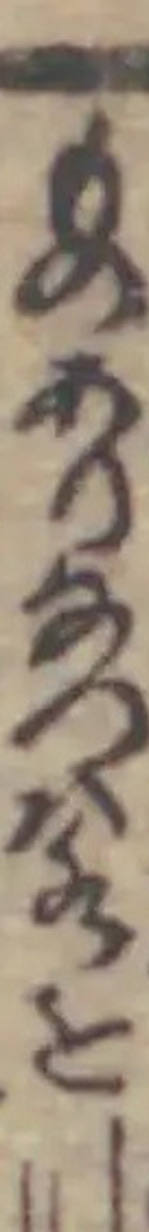ものありなつは水を
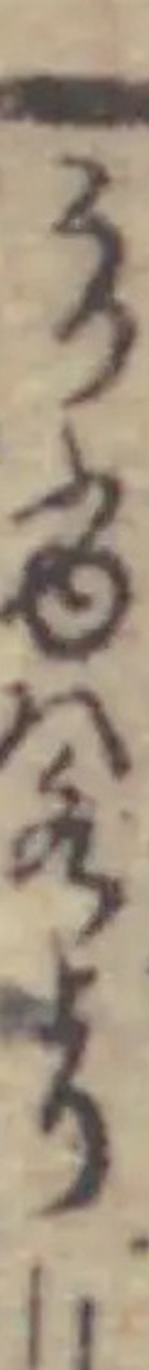うりふゆは水より
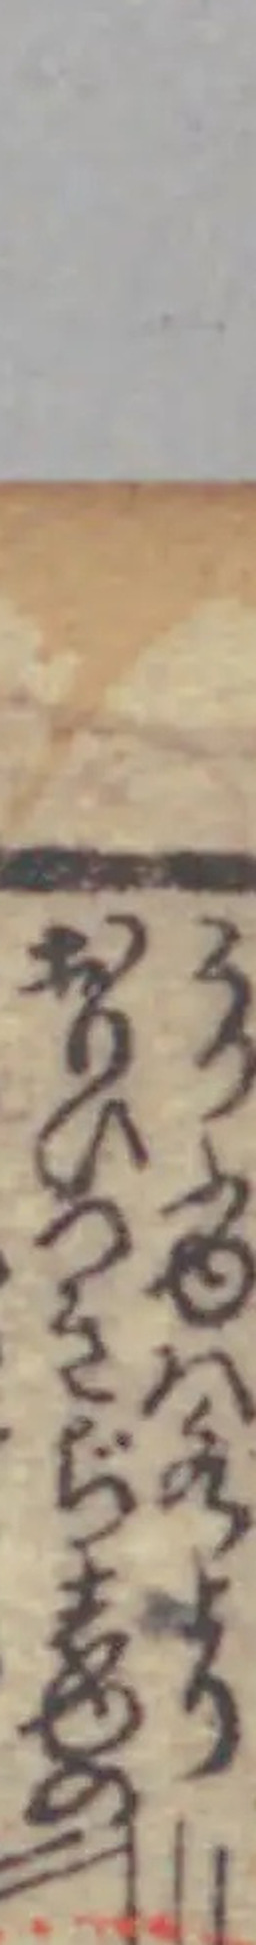おもひつきぢしゆの
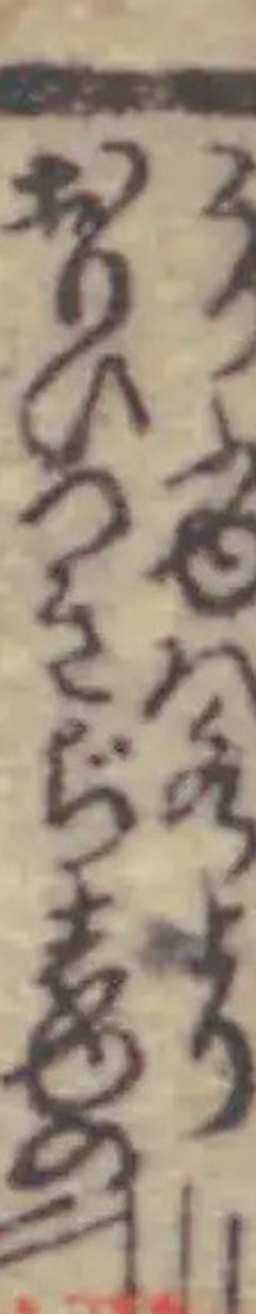おもひつきぢしゆの
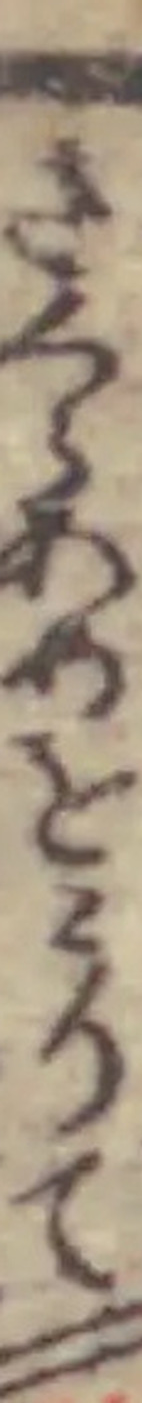さくらあめをうりて
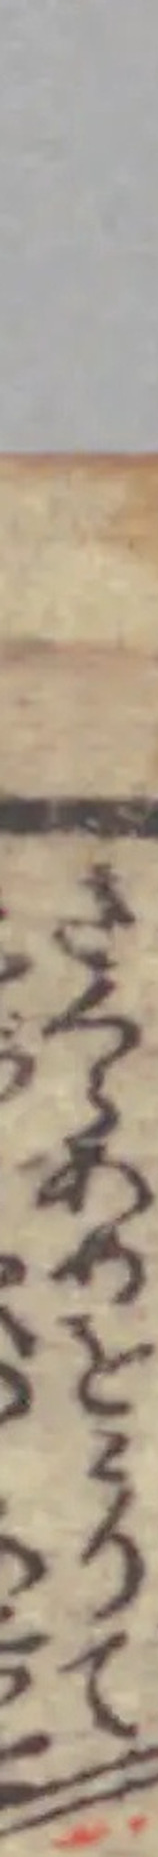さくらあめをうりて
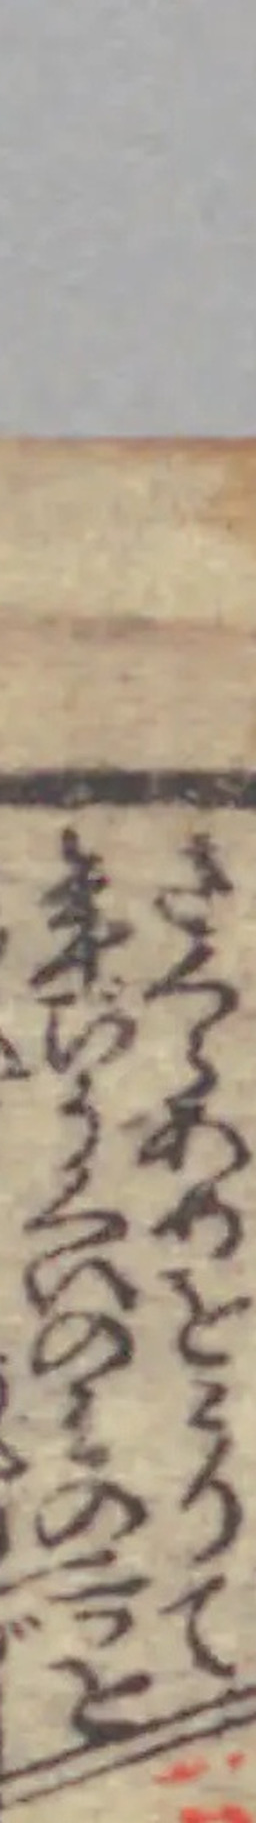年ぢうくいのみの二つを
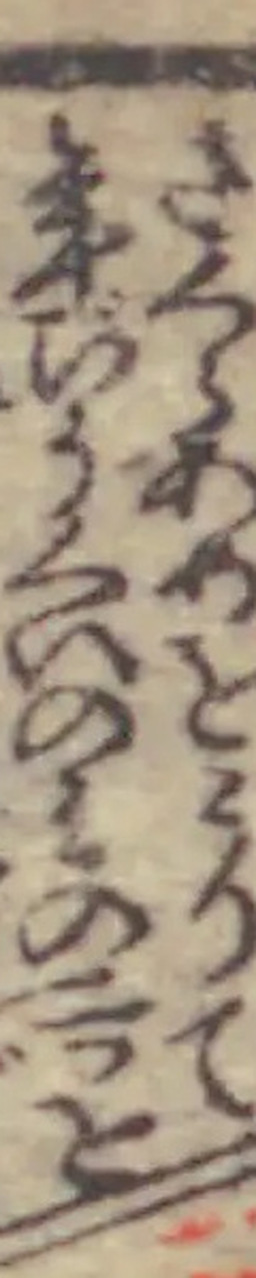年ぢうくいのみの二つを
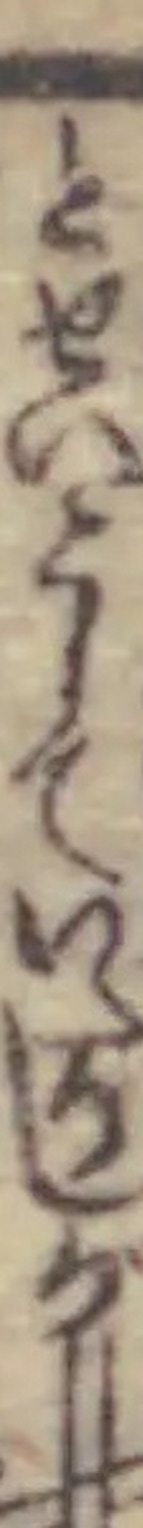とせいとしていたりしが
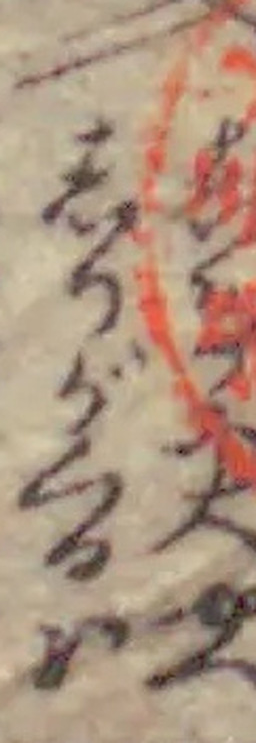しりがくるは
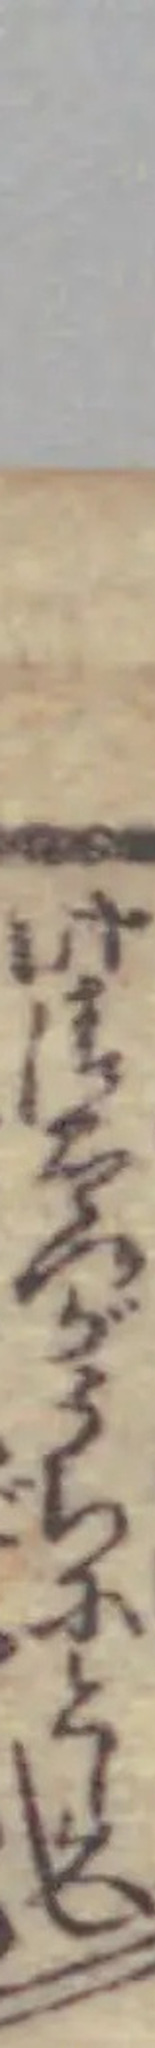此清右エ門がうちにとし久し
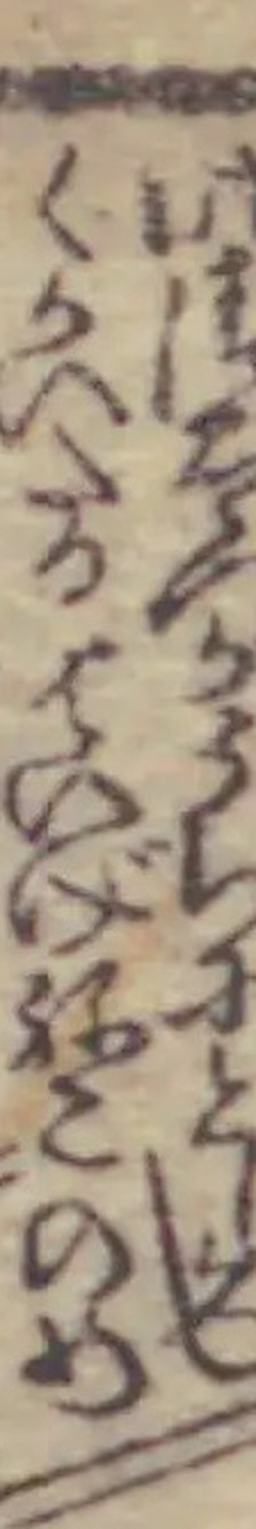くかいたるはいげねこのめ
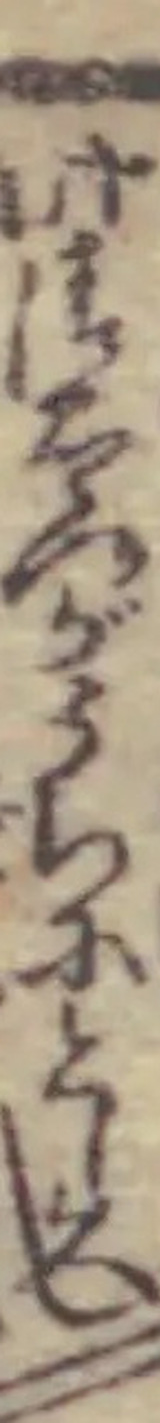此清右エ門がうちにとし久し
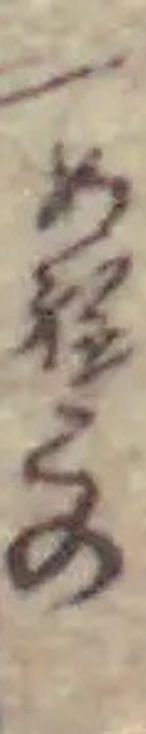めねこの
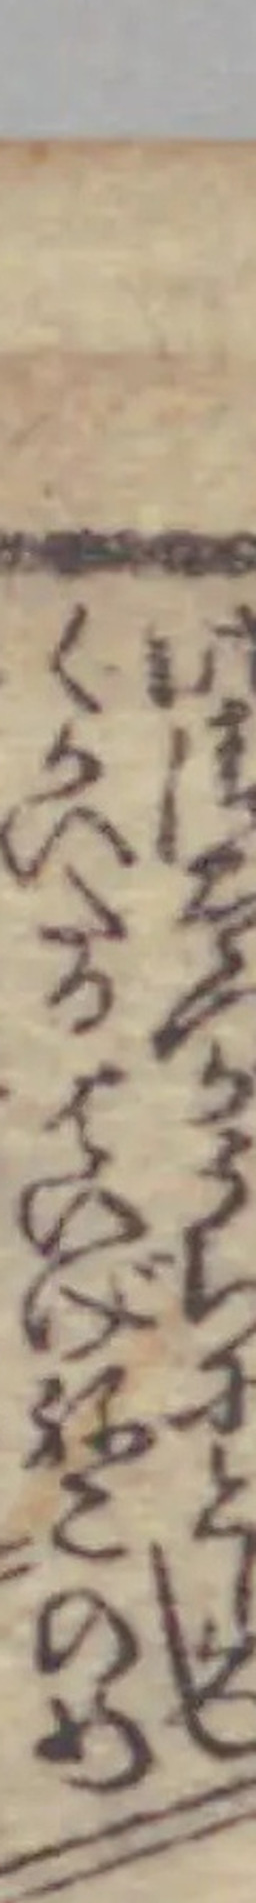くかいたるはいげねこのめ
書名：冷水灰毛猫 2巻
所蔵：国立国会図書館 National Diet Library, JAPAN
